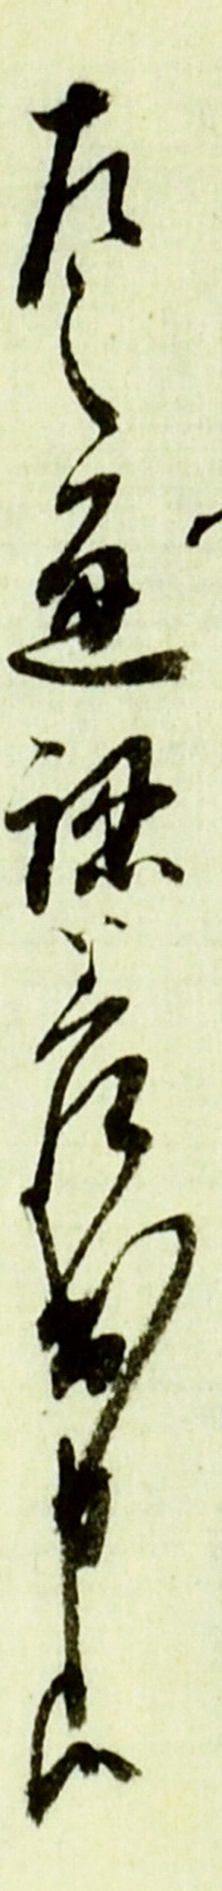左之通認差出申候
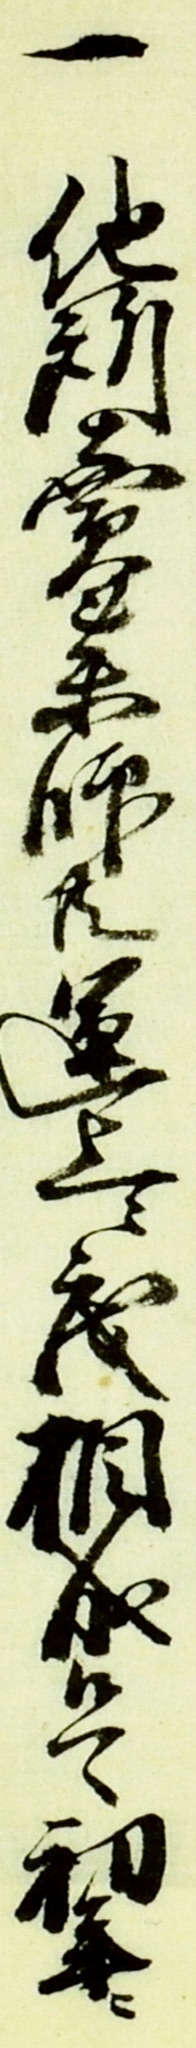一他所売薬師共運上ニ茂相成候ハヽ初年ニ
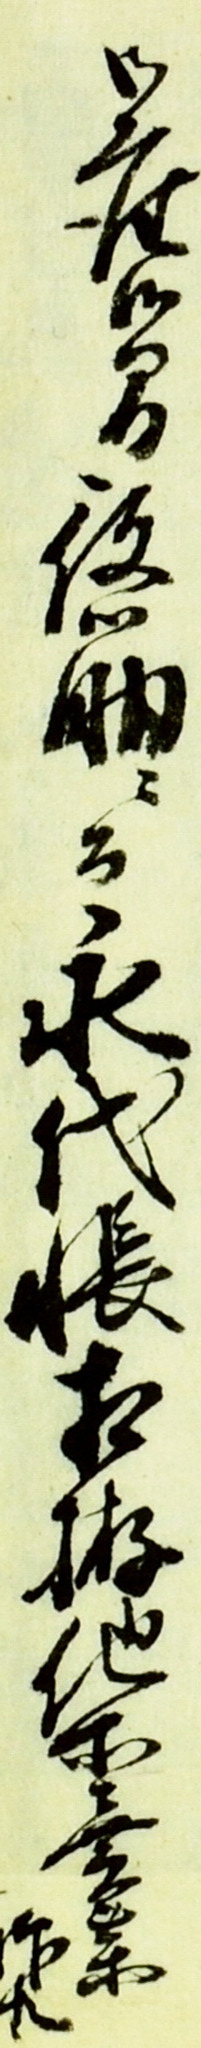御座候間役筋ニ而永代帳相拵他所売薬師共
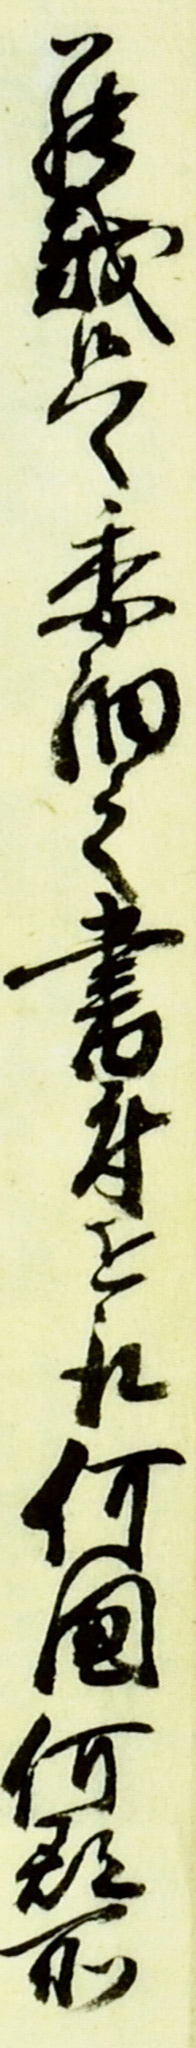罷越候ハヽ委細之書付を取何国何郡所
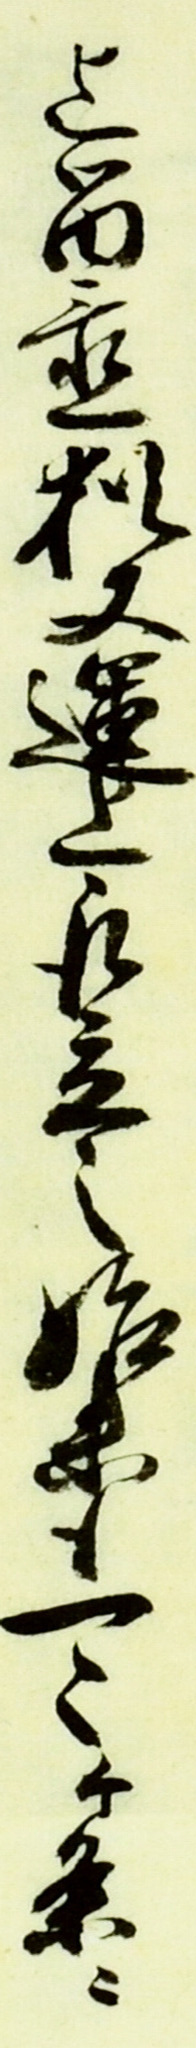迄留置猶又運上取立之始末も一々ヶ条ニ
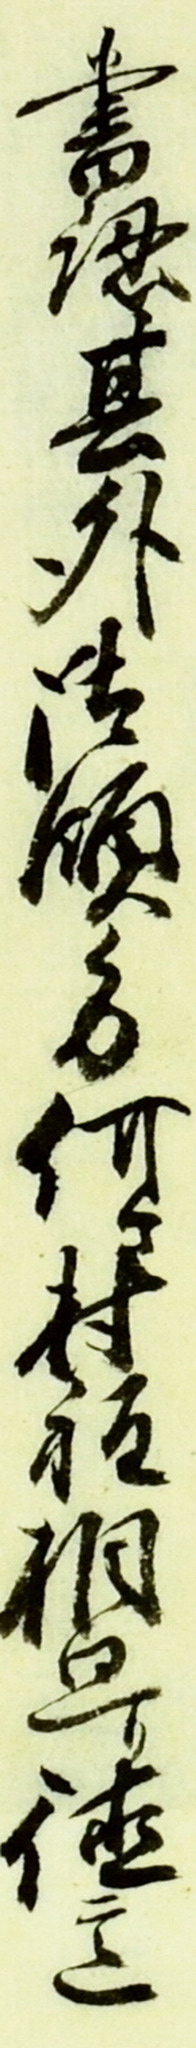書認其外御領分何ヶ村程相廻り徳意
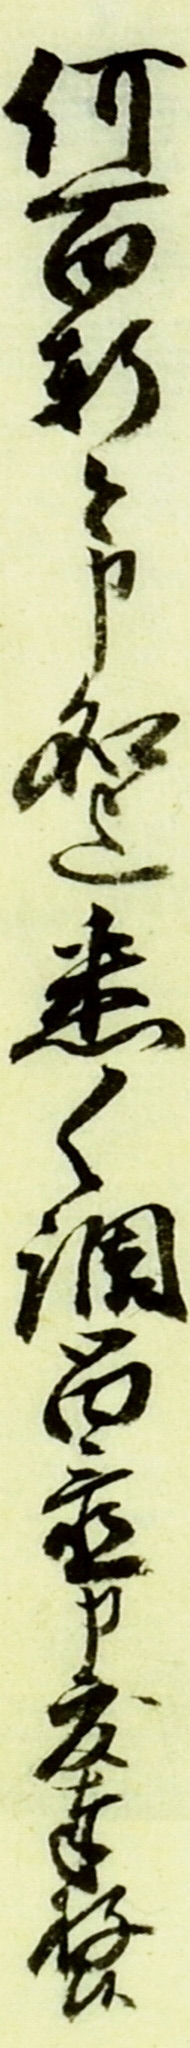何百軒と申処迄悉く調留置申度奉存候
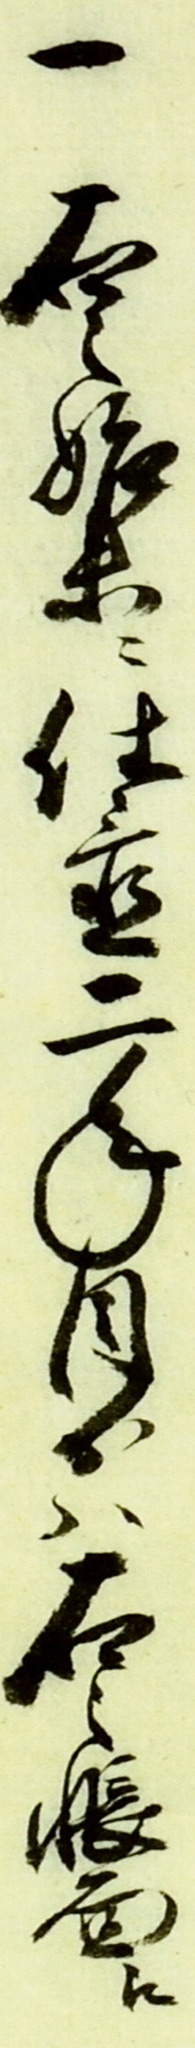一右之始末ニ仕置二年目ゟハ右之帳面江
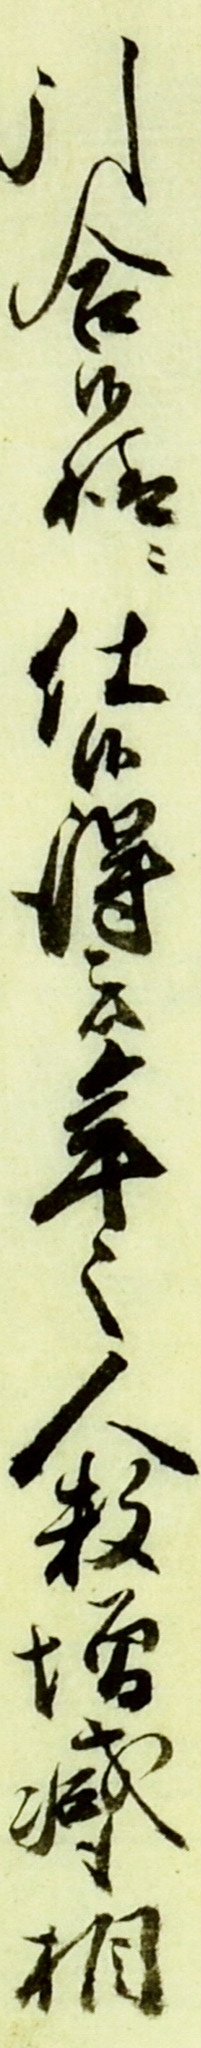引合候様ニ仕候得者年々人数増減も相
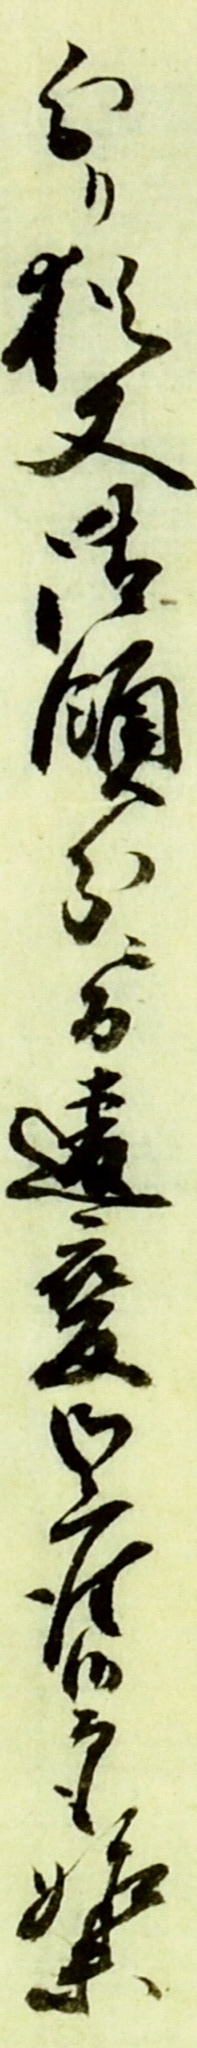分り猶又御領分ニ而違変御座候而も始末
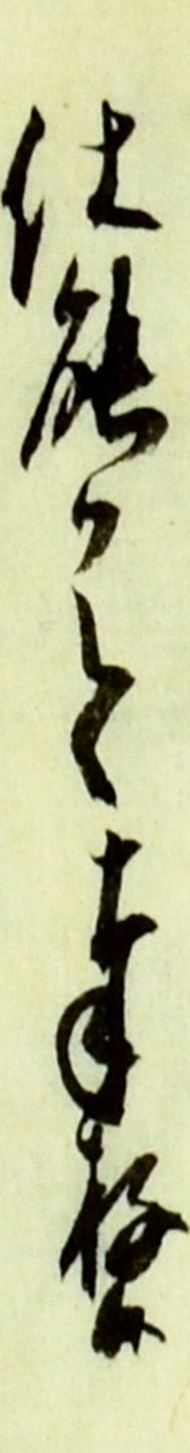仕能クと奉存候
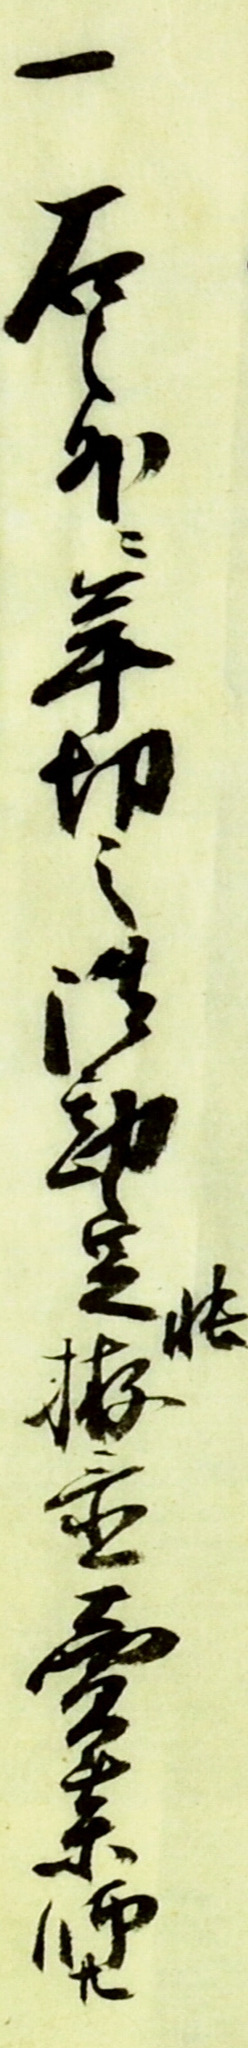一右之外ニ年切之御勘定帳拵置売薬師共

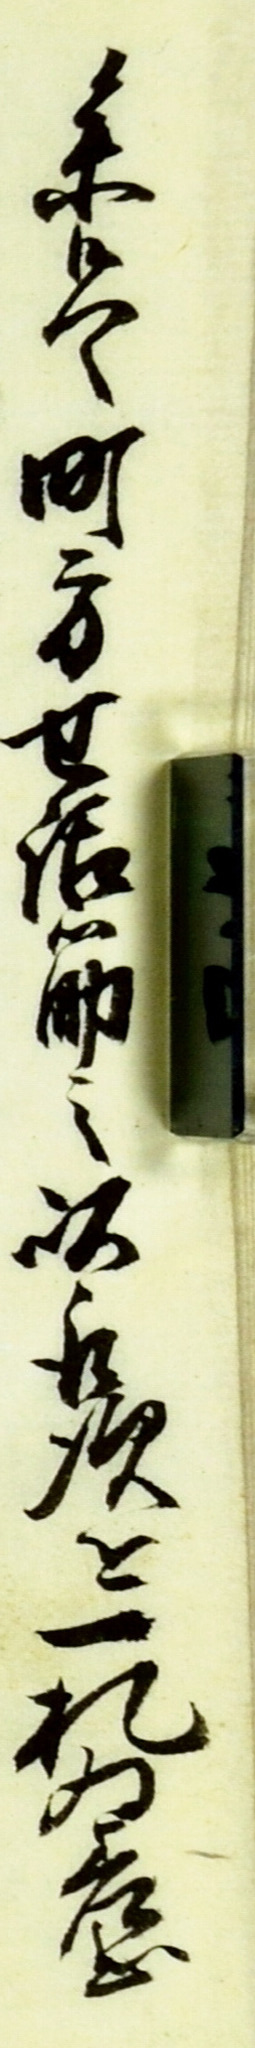参候ハヽ町方世話筋之以取次を一札為差上
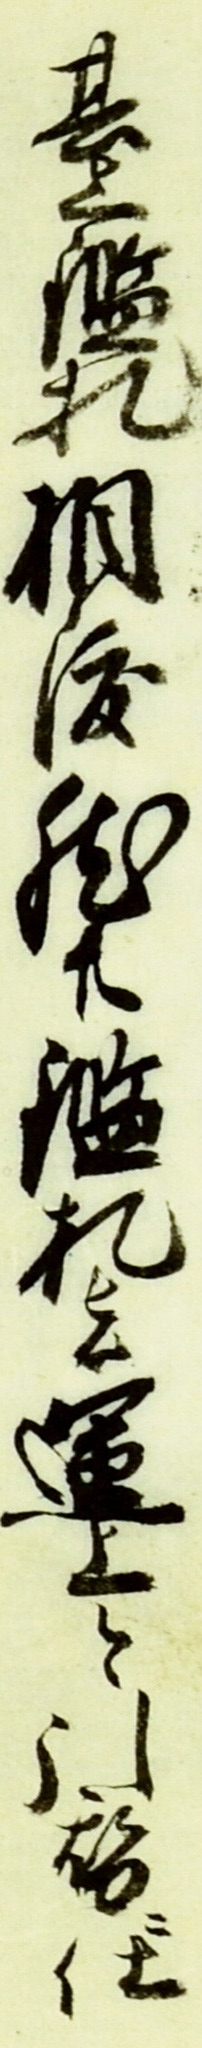其上ｋ鑑札相渡然共鑑札者運上と引替ニ仕
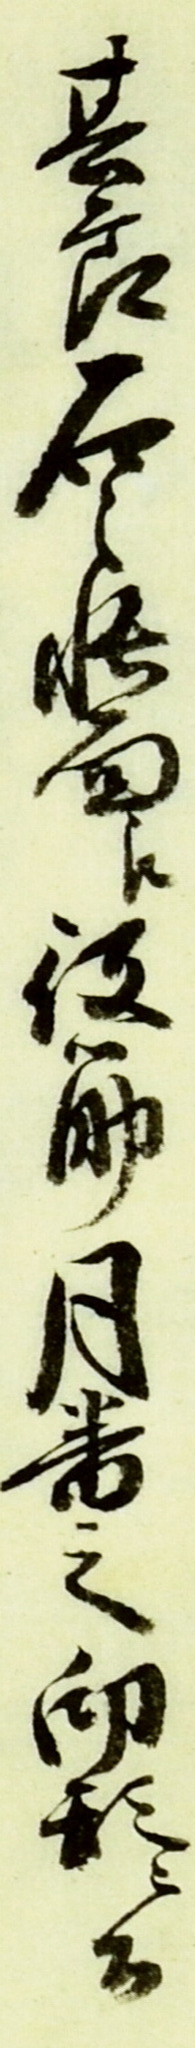其節石之帳面江役筋月番之印形ニ而
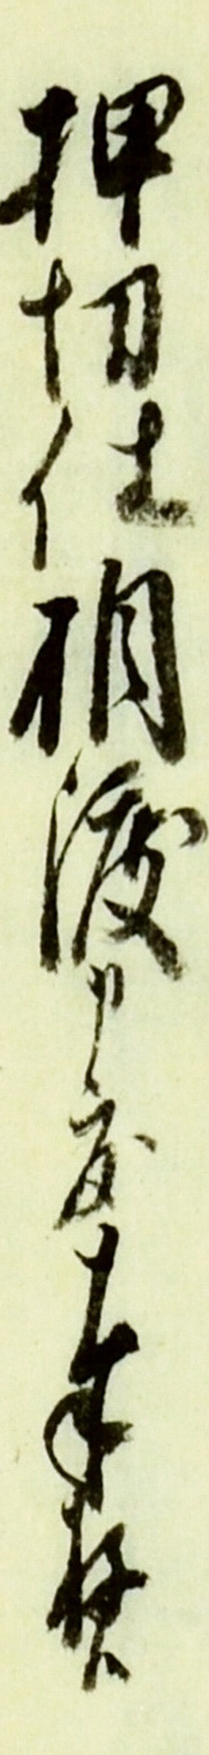押切仕相渡申度奉存候
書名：他国賣薬師運上之事
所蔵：伊那市立高遠町図書館・合同会社AMANE
